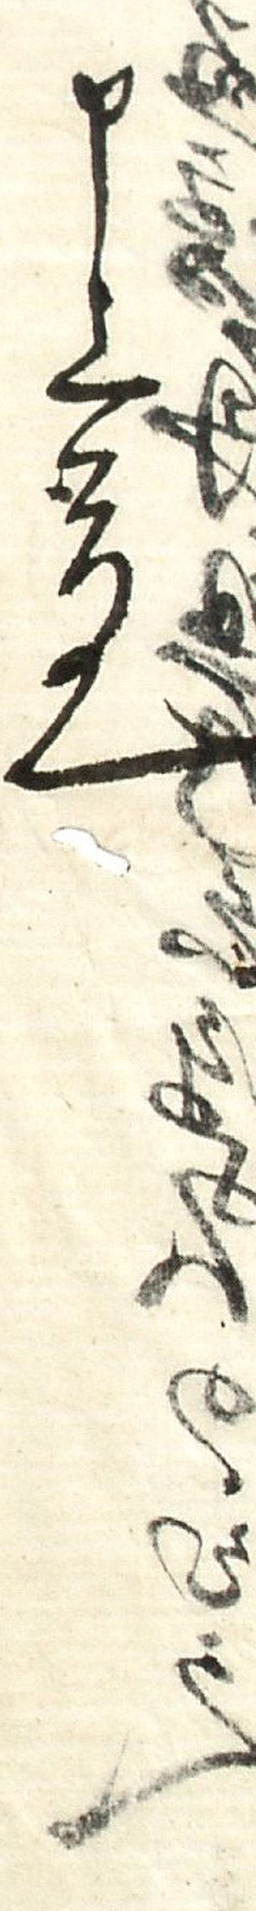申上覚
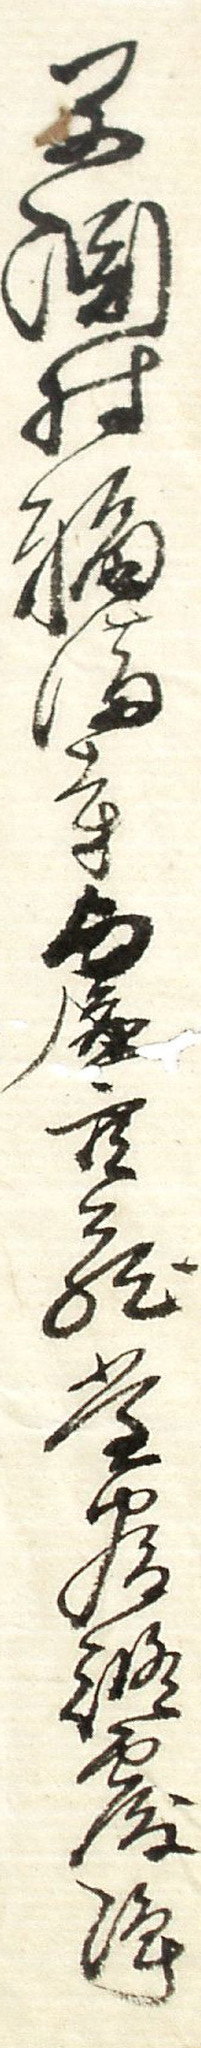早淵村福満寺虚空蔵堂為修覆浄
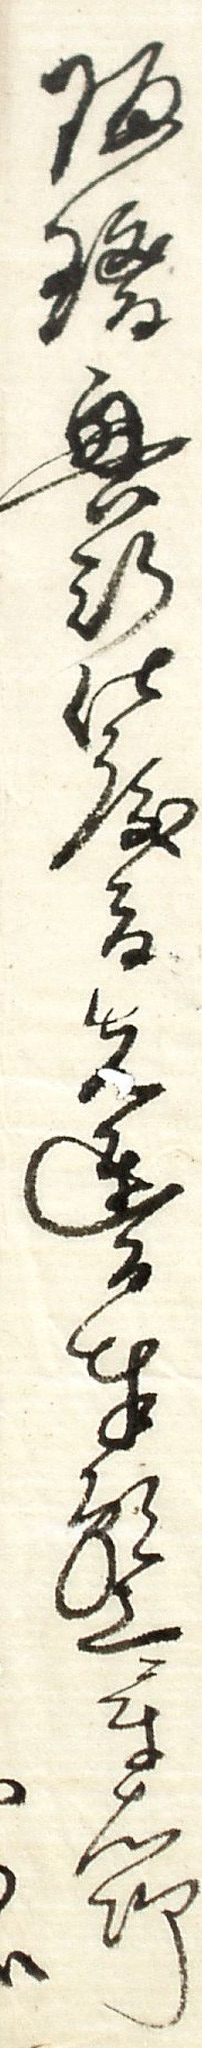瑠璃興行仕度旨先達而奉願上ニ付右御
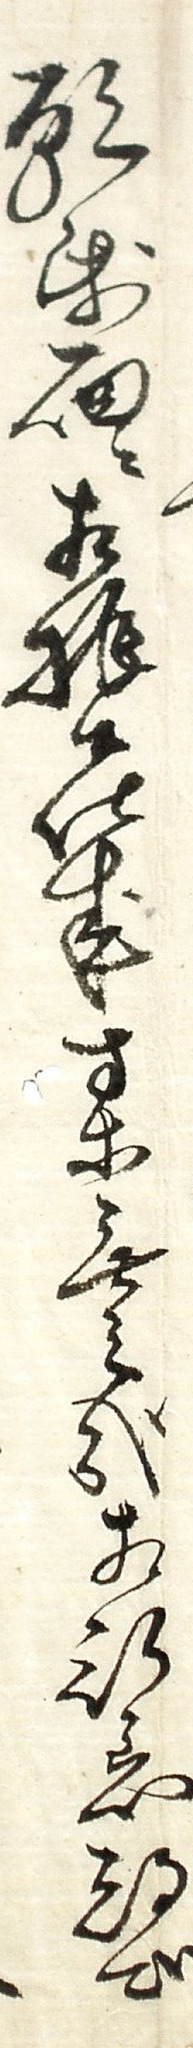願帋面ニ相振候仕成方等無之哉相行着願書
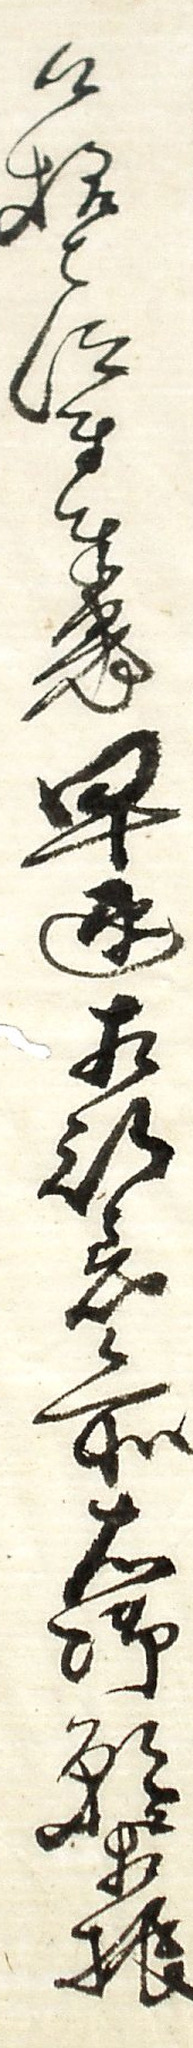候様被仰付奉畏早速相行着候所右御願ニ相振
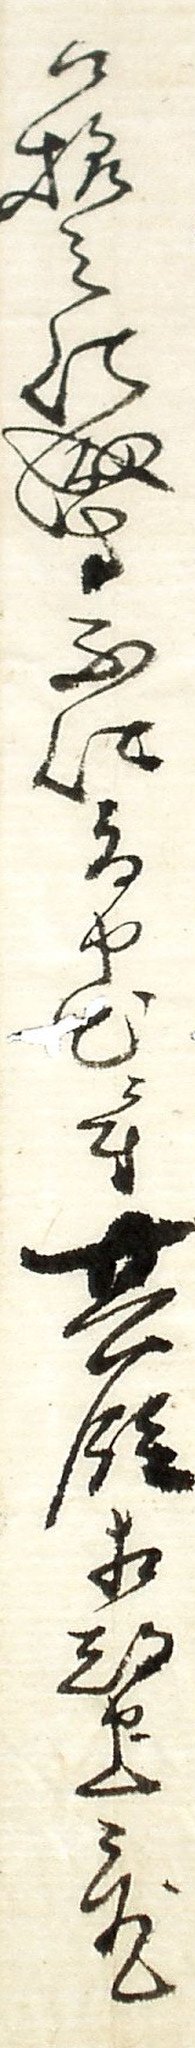候様之仕成方不仕旨申出ニ付其段相願申上置
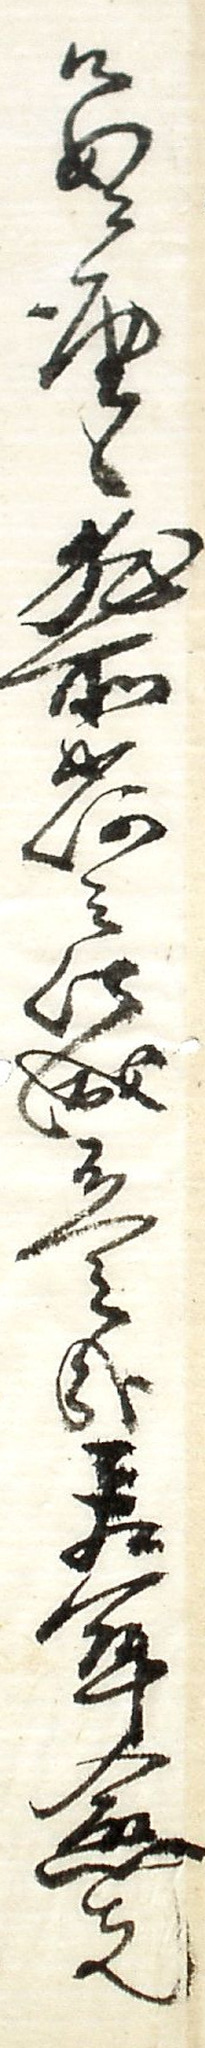候義ニ御座候然所如何之仕成有之哉被相聞愈先
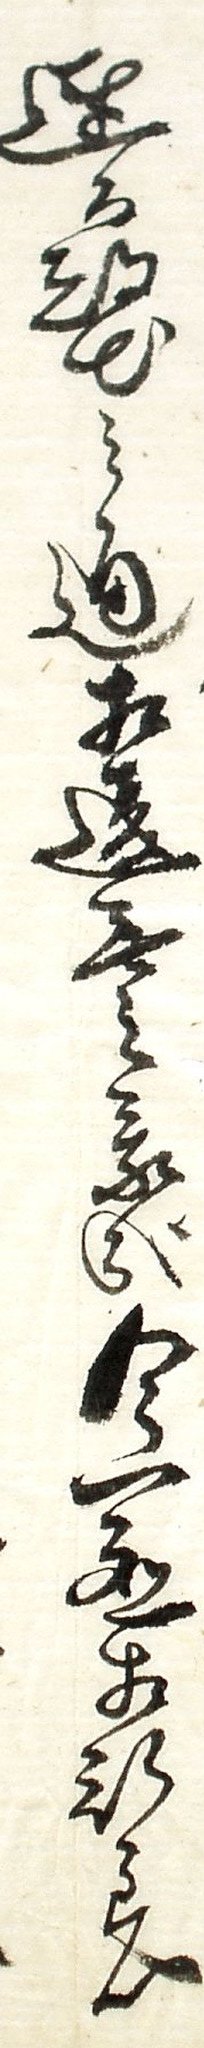達而願書之通相違無之義哉今一應相行着
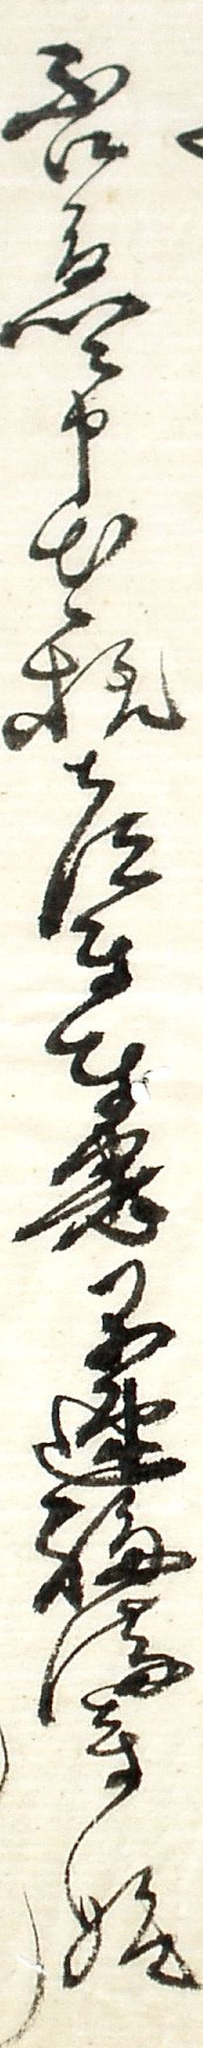否應ニ申出候様被仰付奉畏早速福満寺始
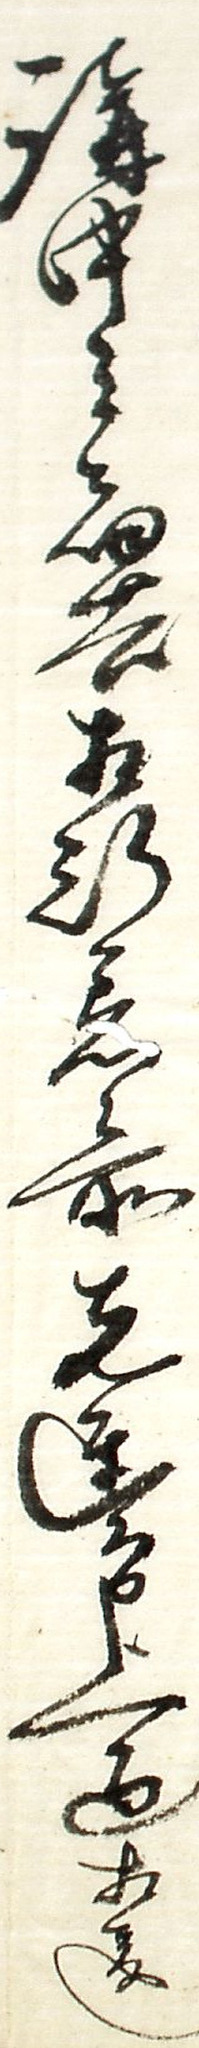講中之者共相行着候所先達而申上通相違
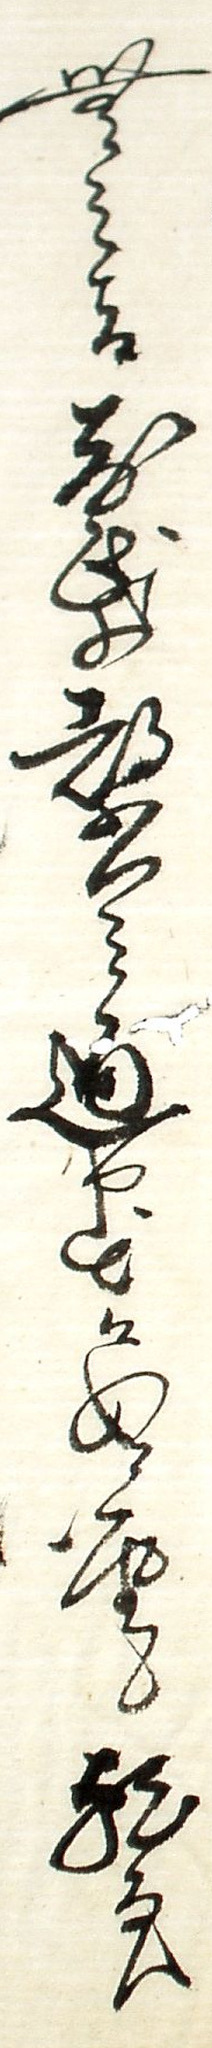無之旨別帋願書之通申出候義ニ御座候就而ハ
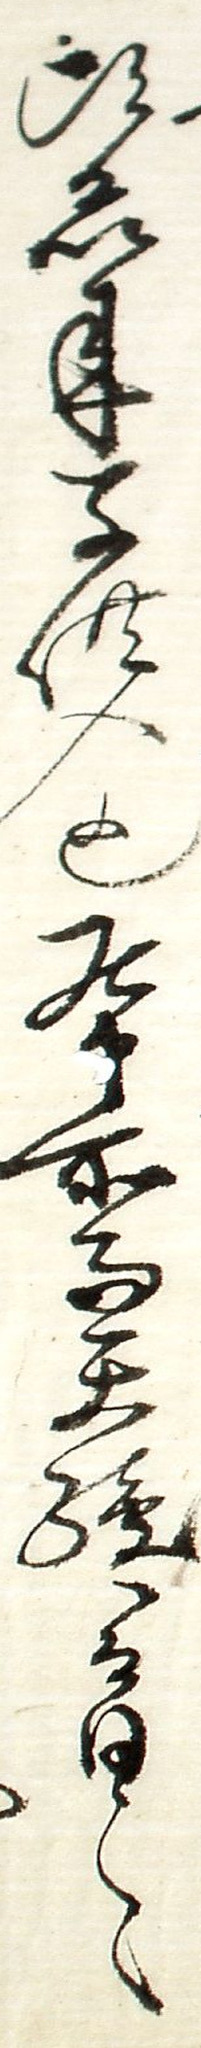頃日以来子供入込居申所雨天強候而日々
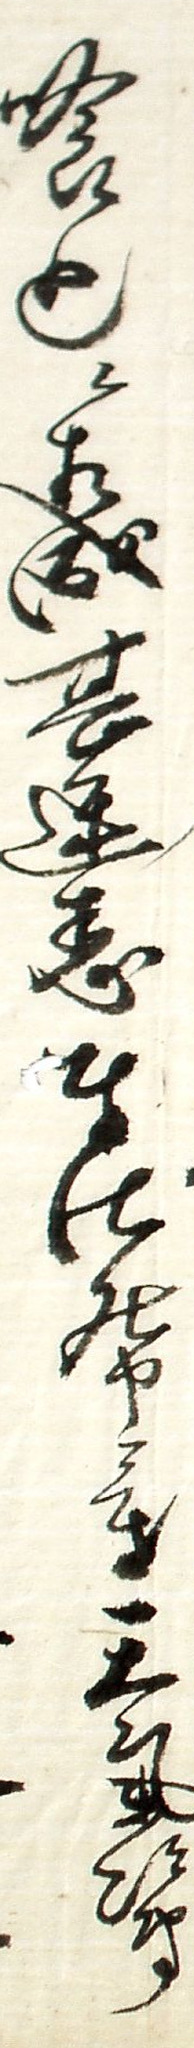喰込ニ相成甚迷惑奉仕居申ニ付天気次第
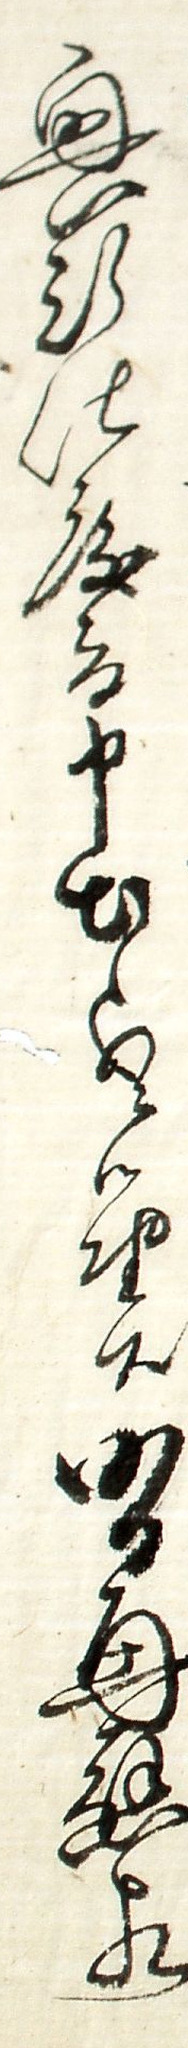興行仕度旨申出候様ニ御座候昨日再應相
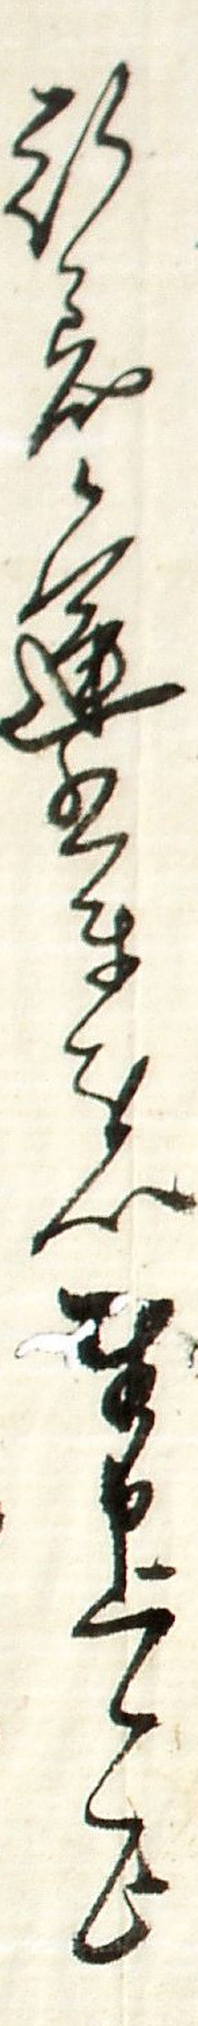行着候運書付を以奉申上候以上
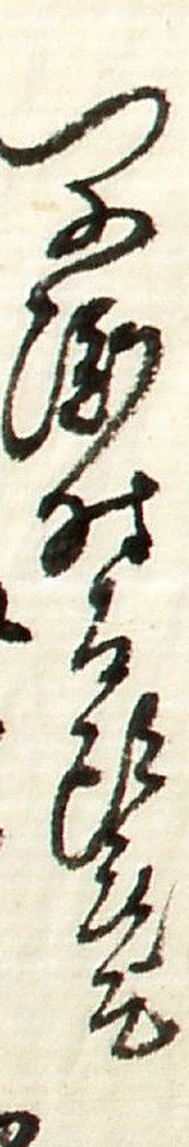早渕村与頭庄蔵
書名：早渕村福満寺浄瑠璃再応行着添書ひかへ
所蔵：鳴門教育大学 Naruto University of Education
